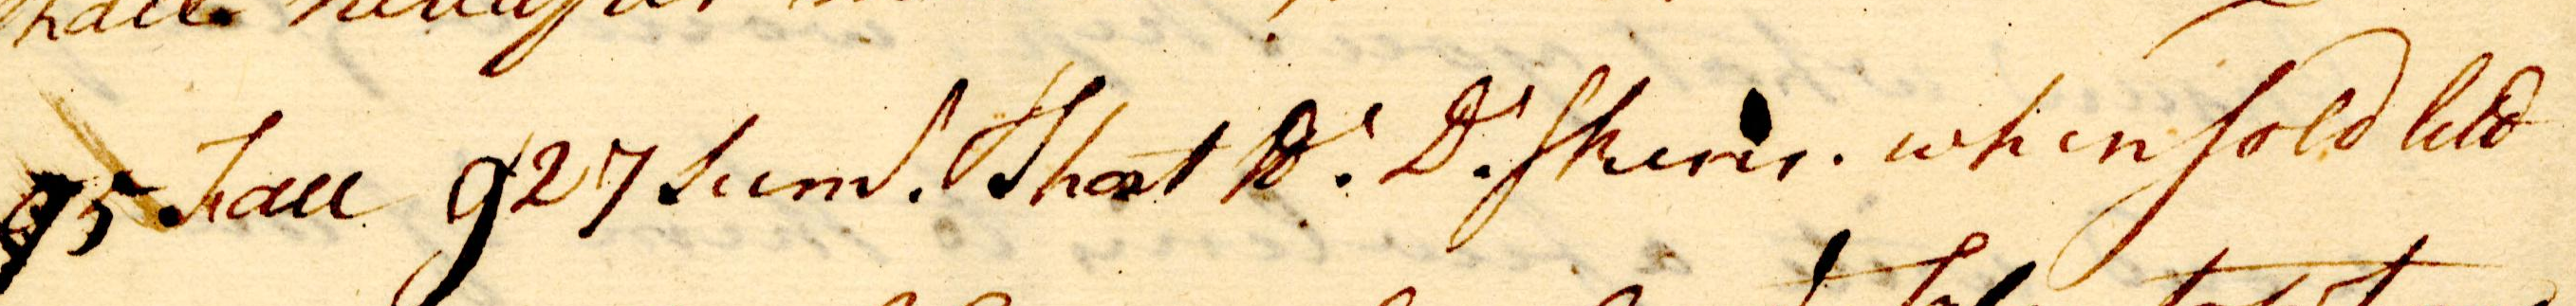95 Fall 927 Sens. sum^t. That D^o. D^o. Skins. when sold leld
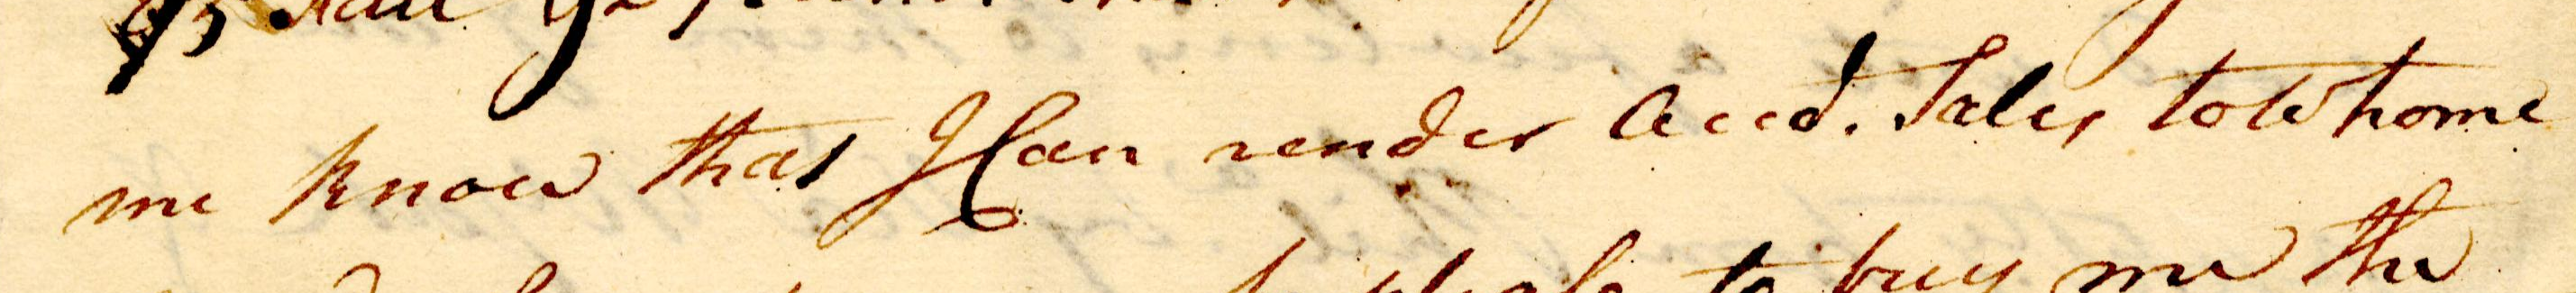me know that I Can render Accot. Sales to be home
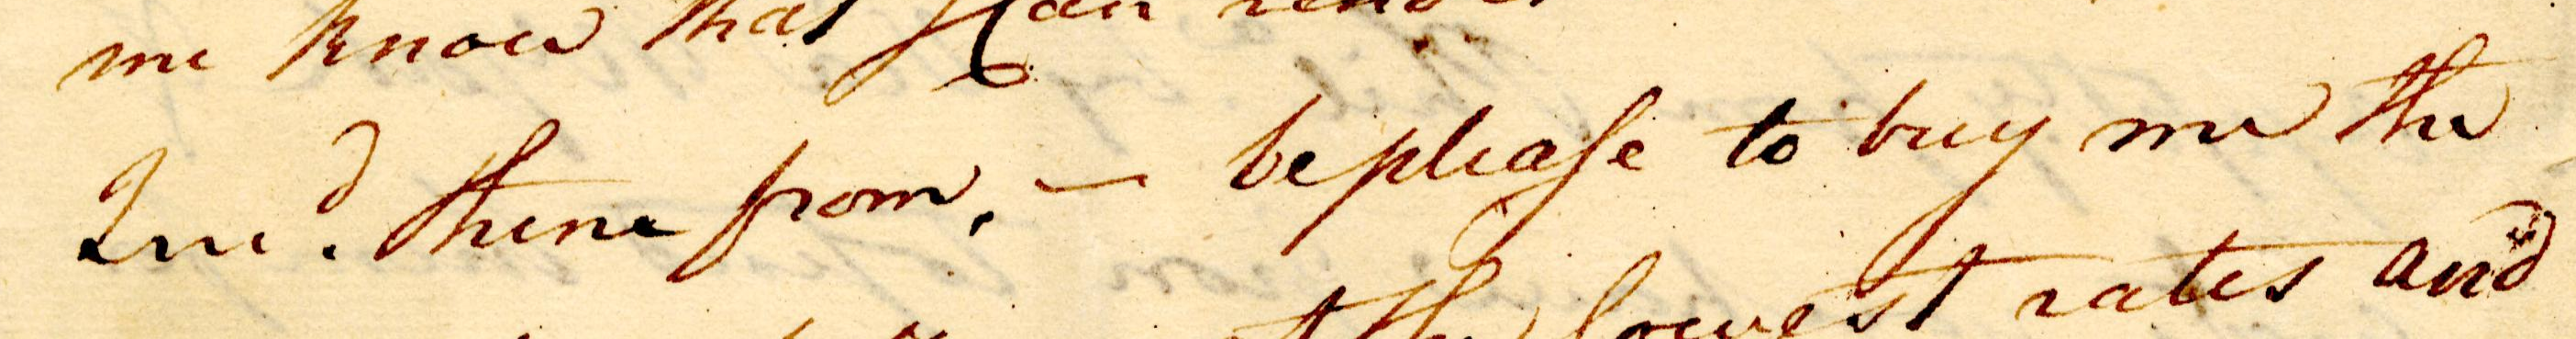Inc^d. there from.- be please to buy me the
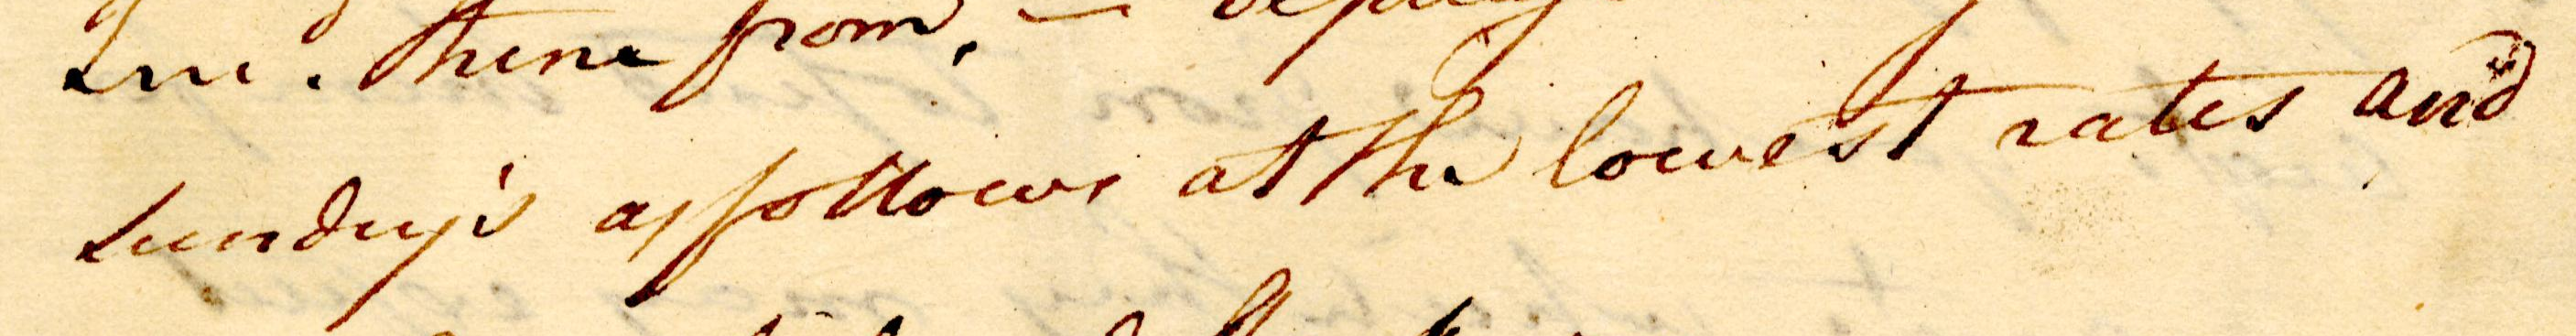Sundrys as follows at the lowest rates and
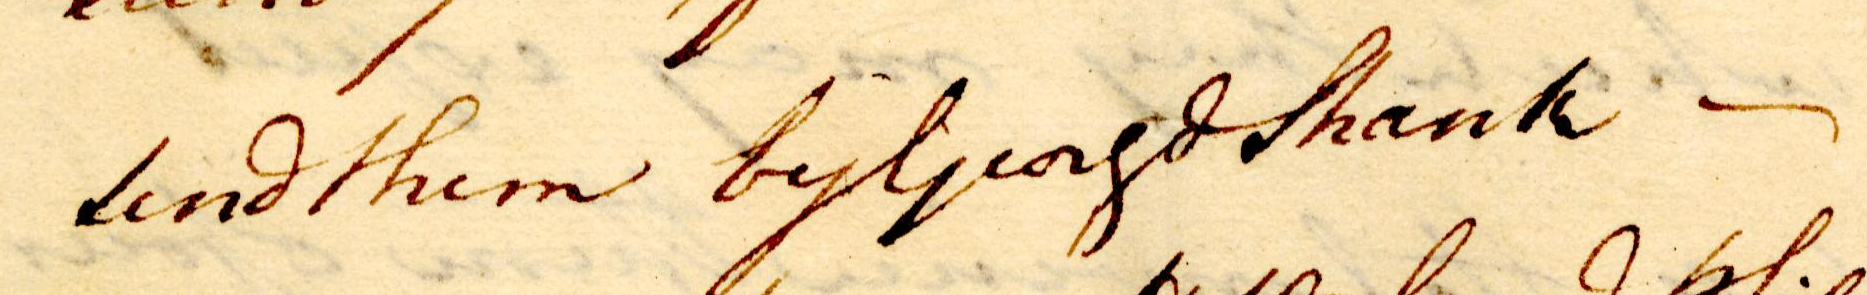Send them by George Shank-
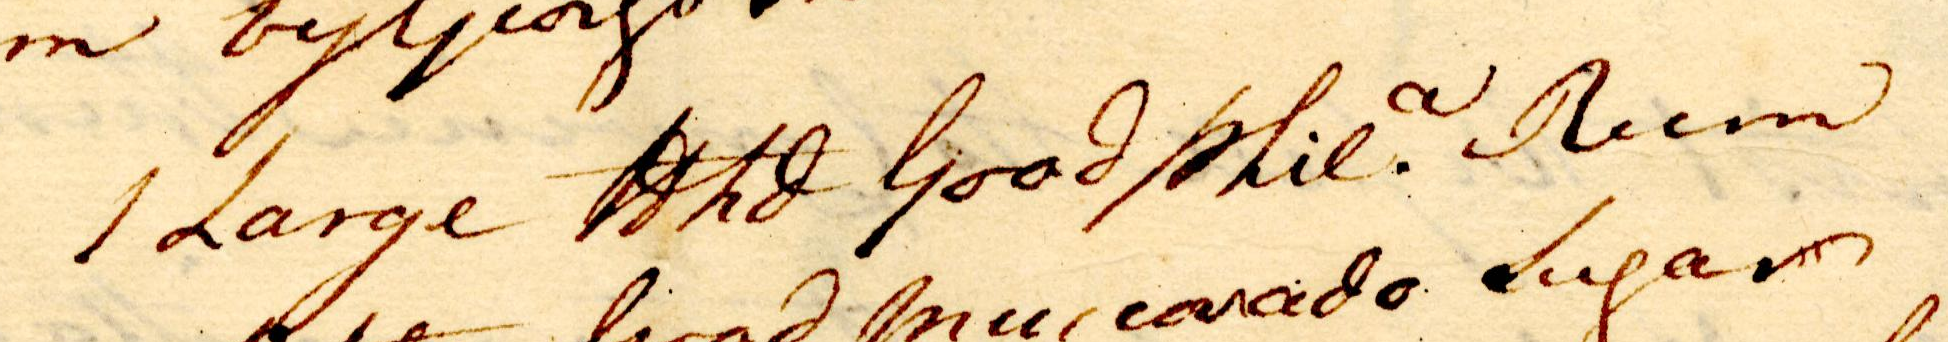1 Large Hhd Good Phil^a Rum
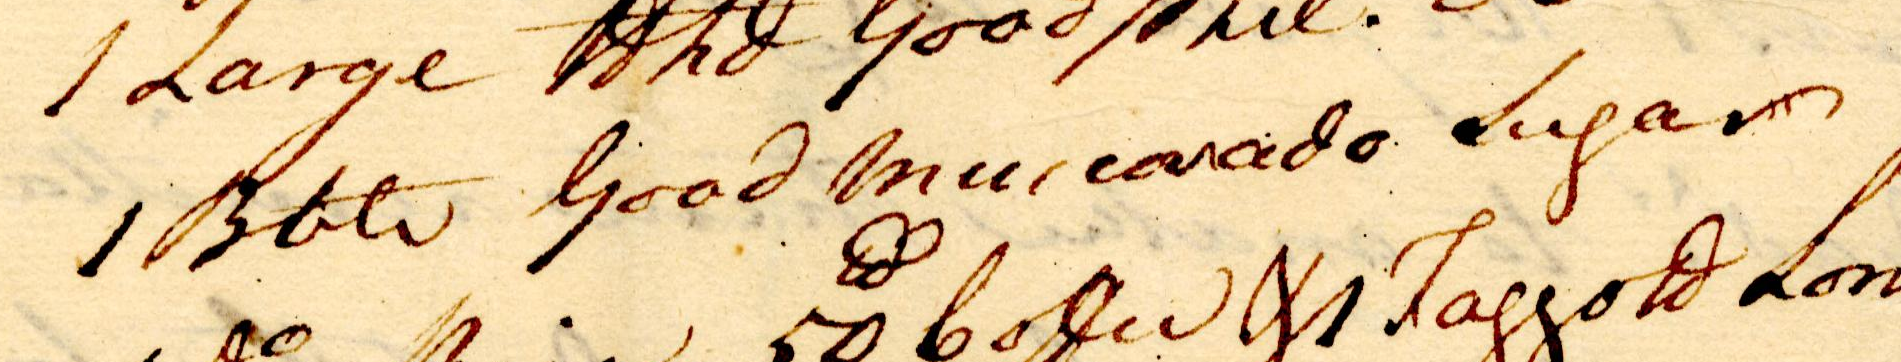1 Btle Good muscovado Sugar
